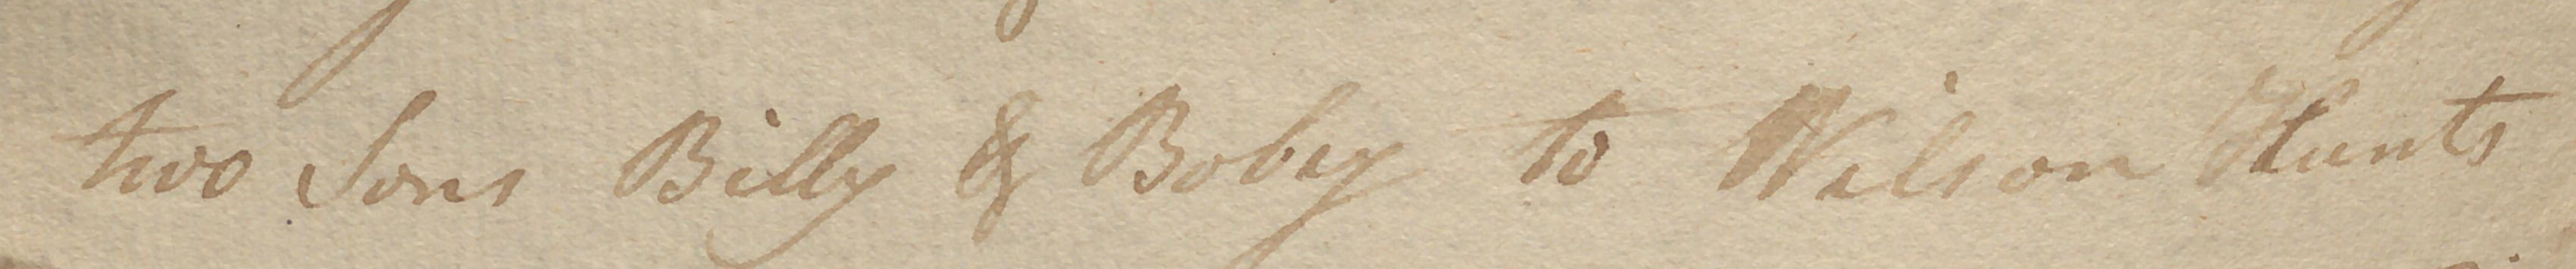two Sons Billy & Bobey to Wilson Hunts
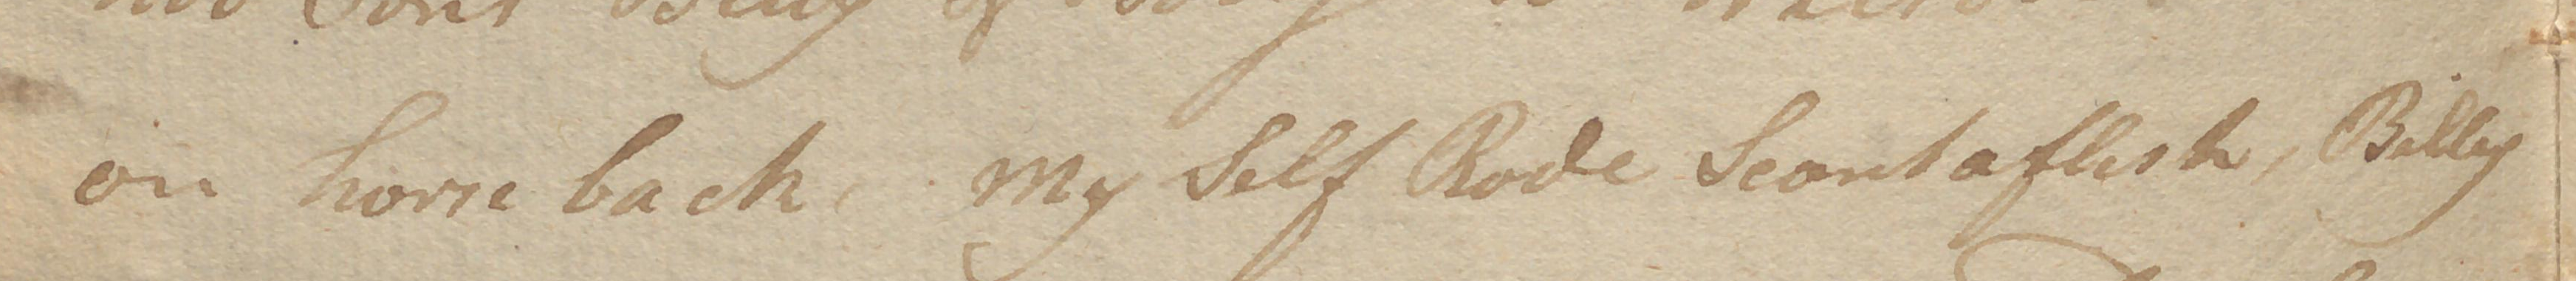on horse back my Self Rode Scontaflesh, Billey
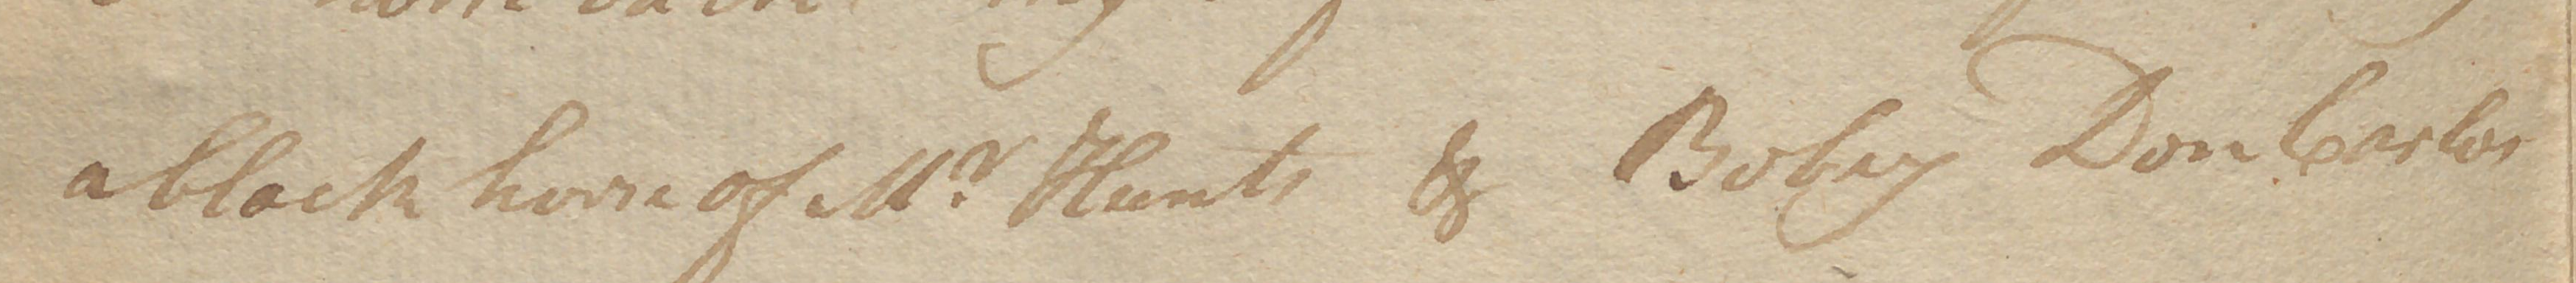a black horse of M^r. Hunts & Bobey Don Carlos
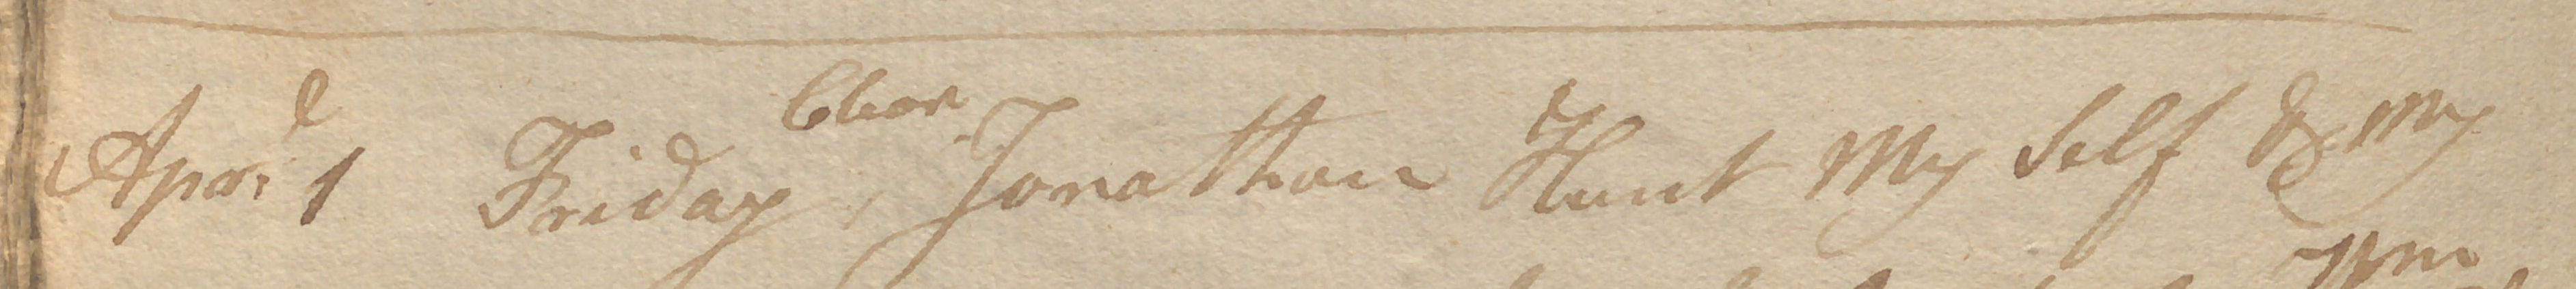Apr^l. 1 Friday, Jonathan Hunt My self & my
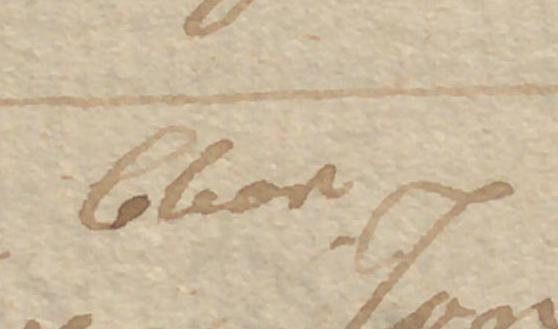Clear
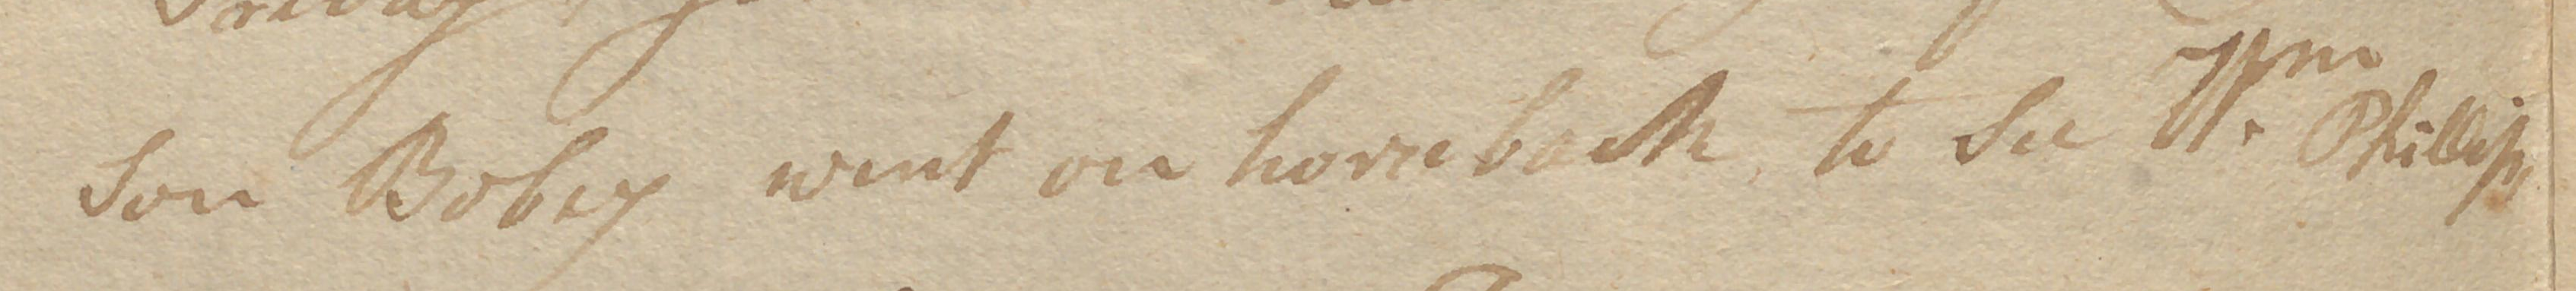Son Bobey went on horseback to see W^m. Phillip
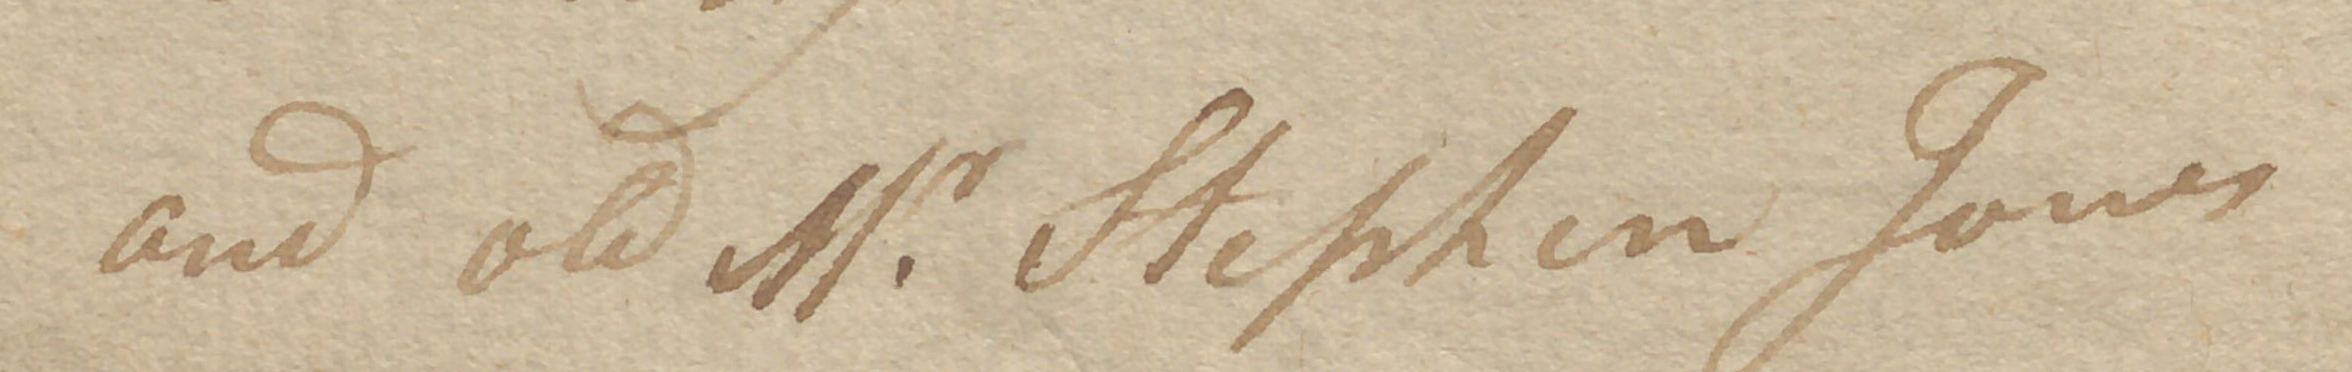and old M^r. Stephen Jones
